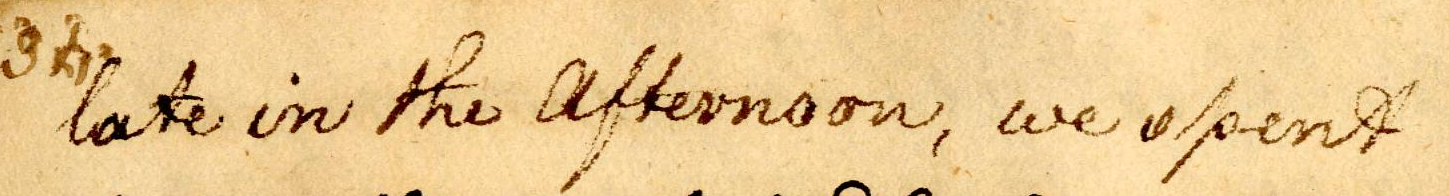late in the Afternoon, we spent
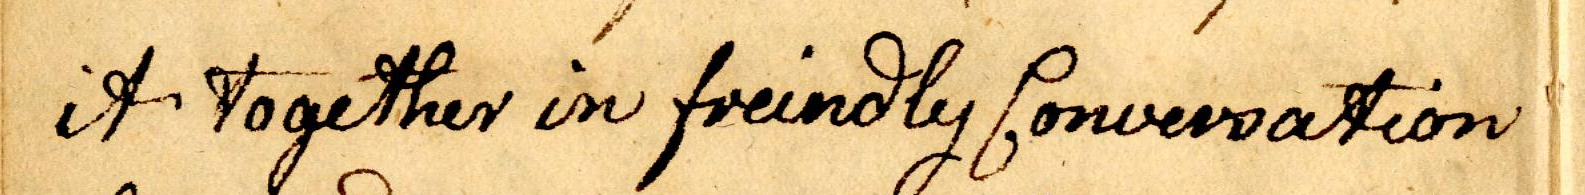it together in freindly Conversation
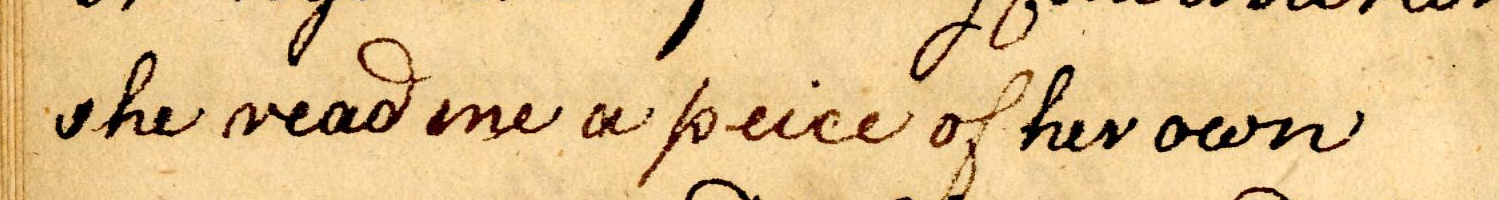she read me a peice of her own
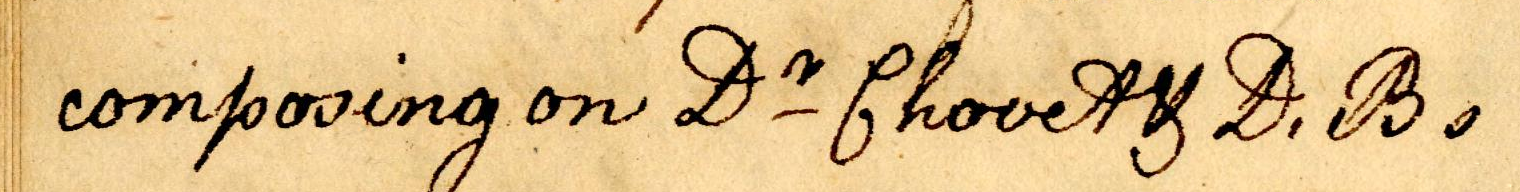composing on D^r Chovet & D. B.
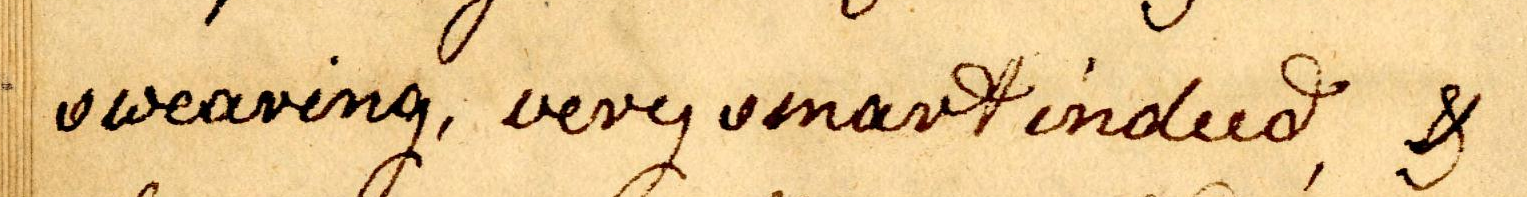swearing, very smart indeed
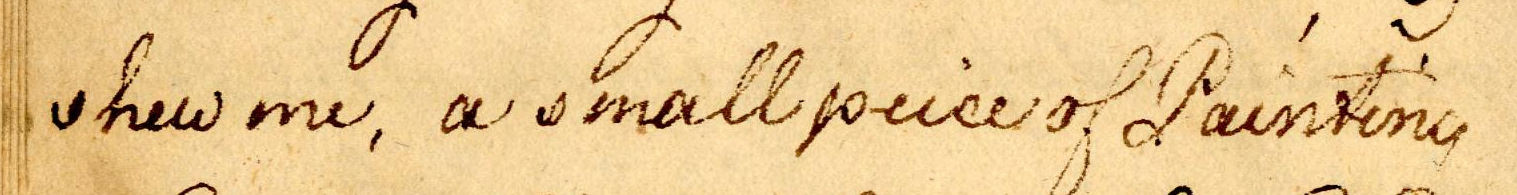shew me, a small peice of Painting
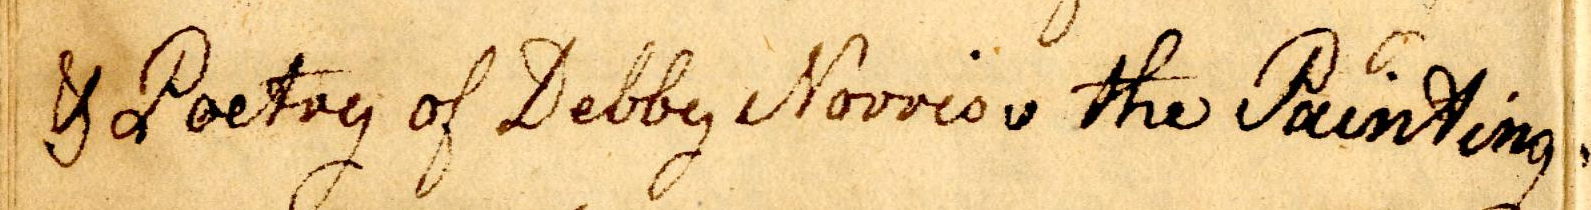& Poetry of Debby Norriss the Painting
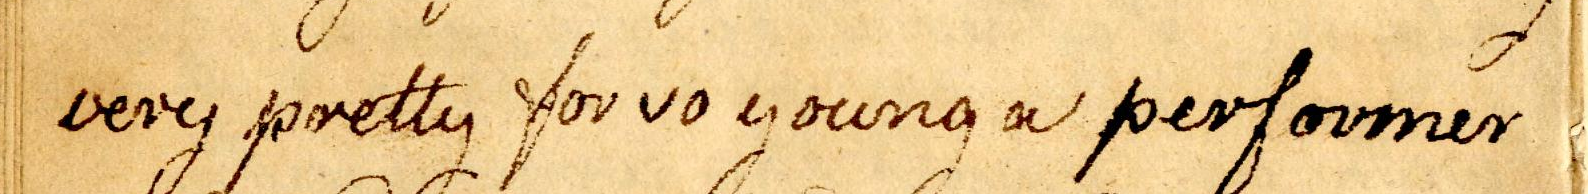very pretty for so young a performer
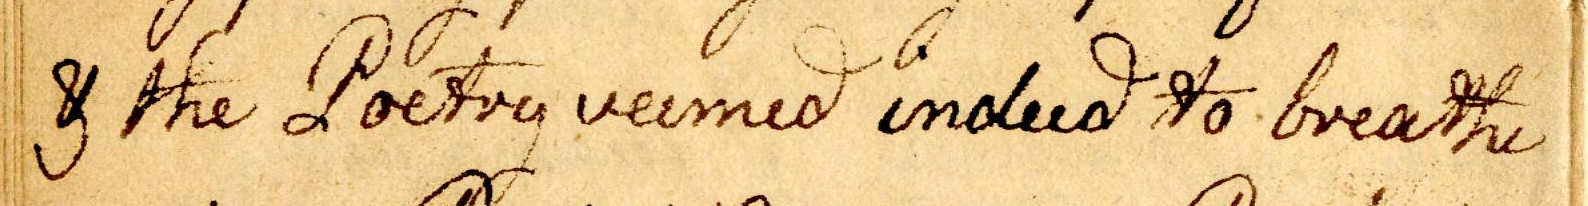& the Poetry seemed indeed to breathe
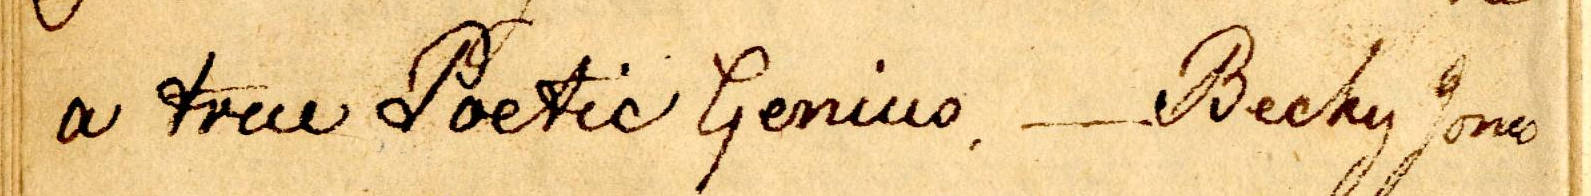a true Poetic Genuis.- Becky Jones
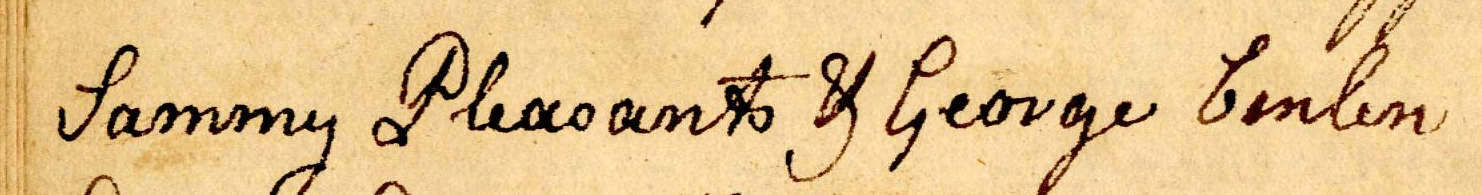Sammy Pleasants & George Emlen
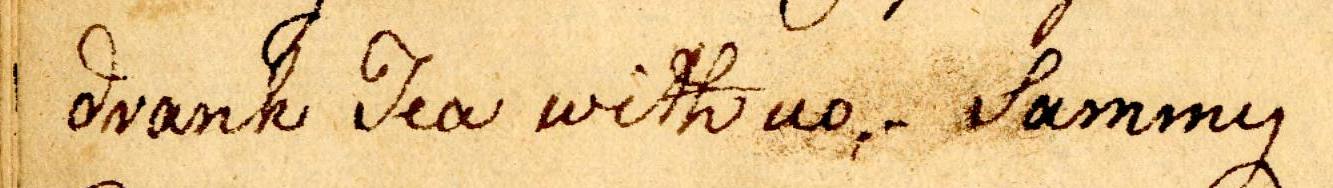drank Tea with us. Sammy
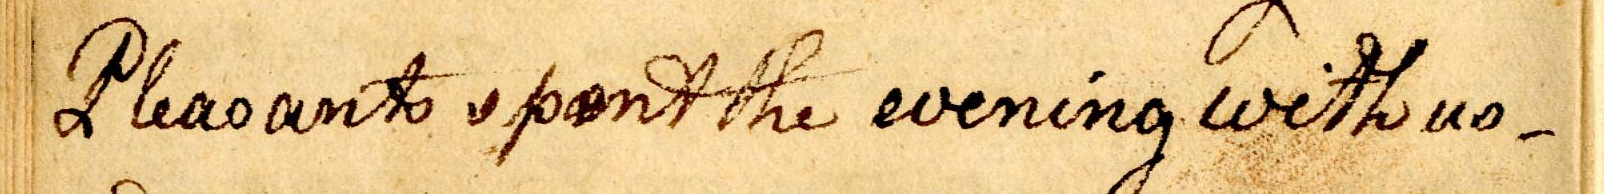Pleasants spent the evening with us-
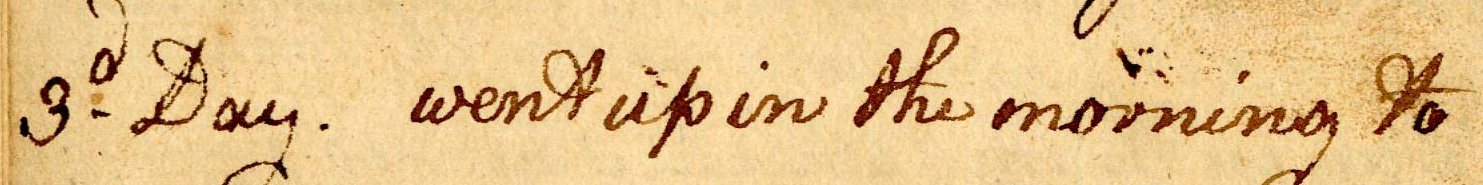3^d Day. went up in the morning to
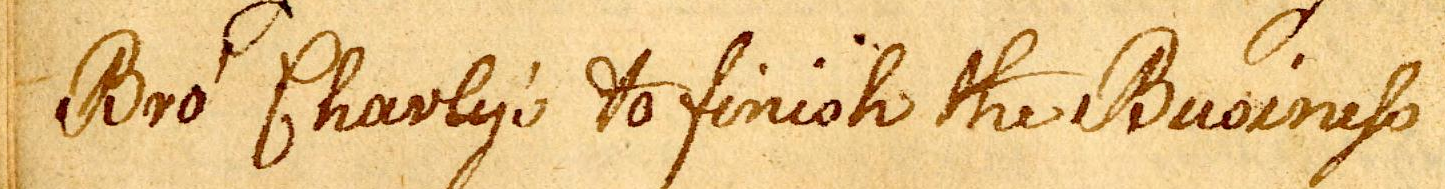Bro' Charly's to finish the Business
